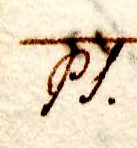PS.
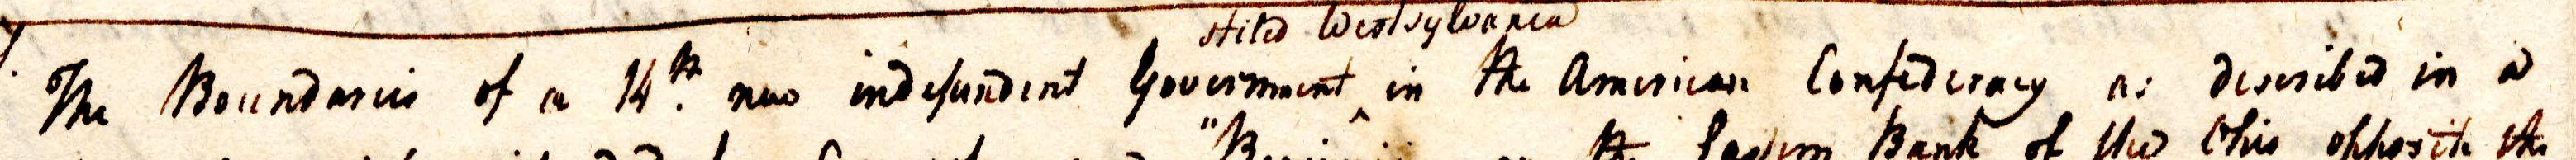The Boundaries of a 14^th. now independent Government ^ in the American Confederacy as described in a
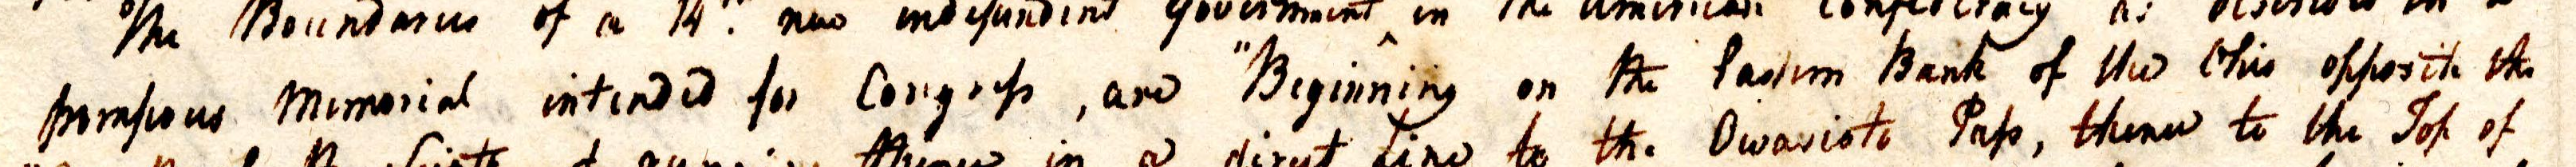pompous memorial intended for Congress, are "Beginning on the Eastern Bank of the Ohio opposite the
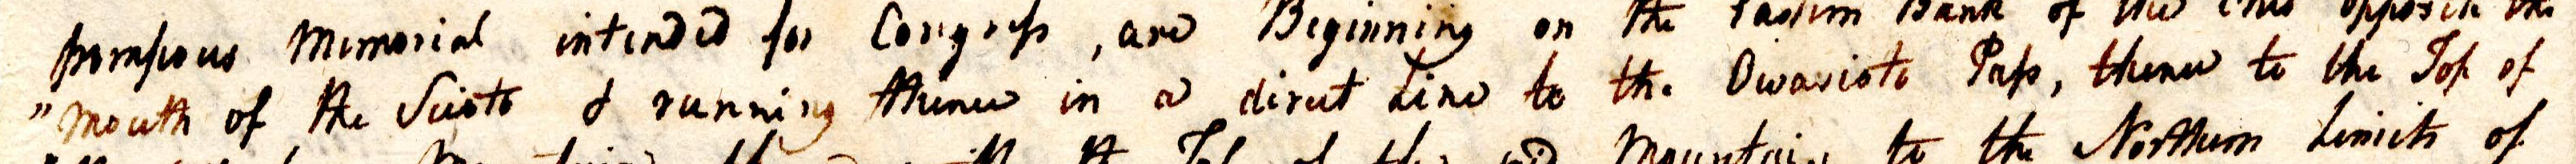"Mouth of the Scioto & running thence in a direct Line to the Owasioto Pass, then to the Top of
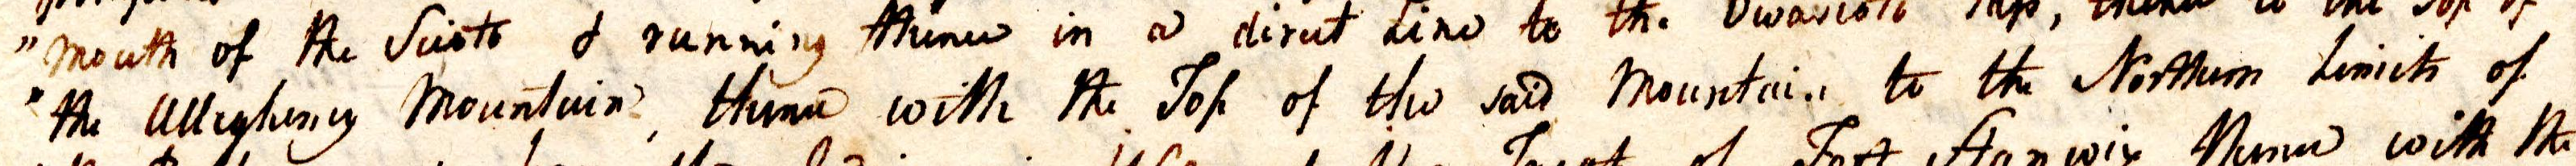"the Allegheny Mountain, thence with the Top of the said mountain to the Northern Limits of
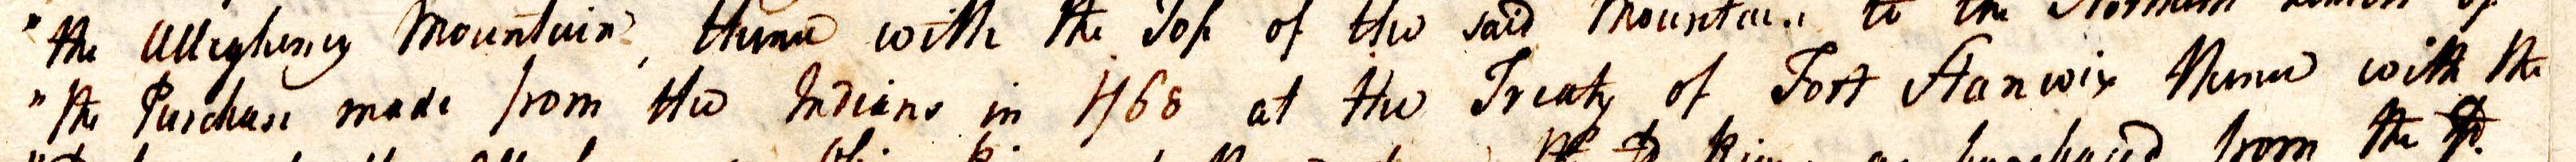"the Purchase made from the Indians in 1768 at the Treaty of Fort Stanwix there with the
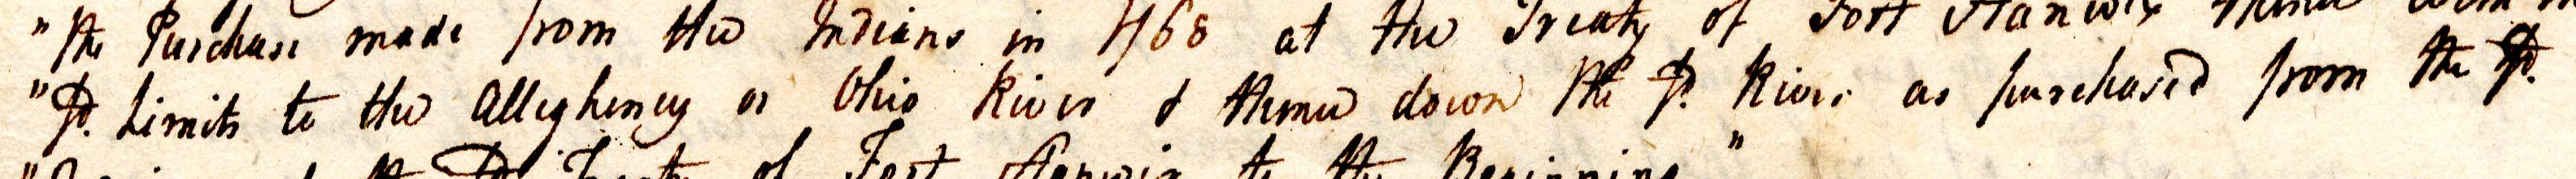"p. Limits to the Allegheny or Ohio River & thence down the P. River as purchased from the P.
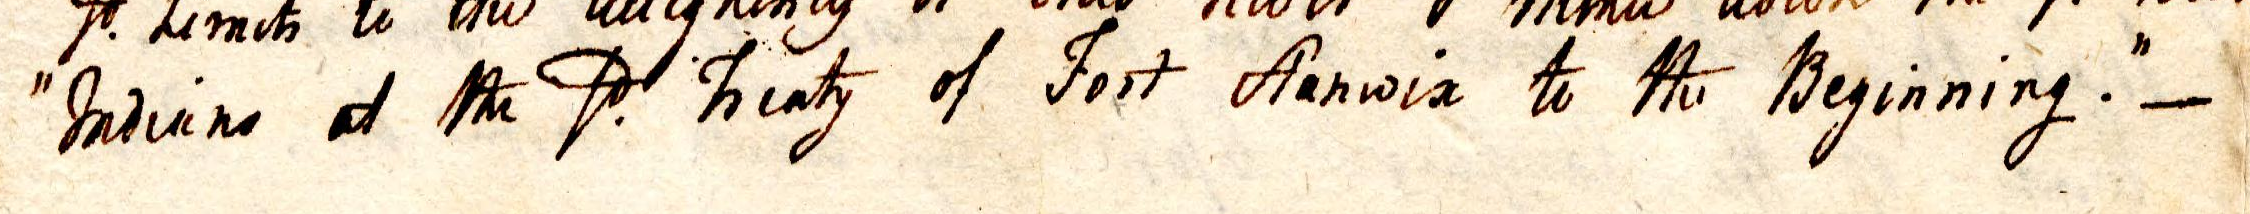"Indians at the P. Treaty of Fort Stanwix to the Beginning."-
